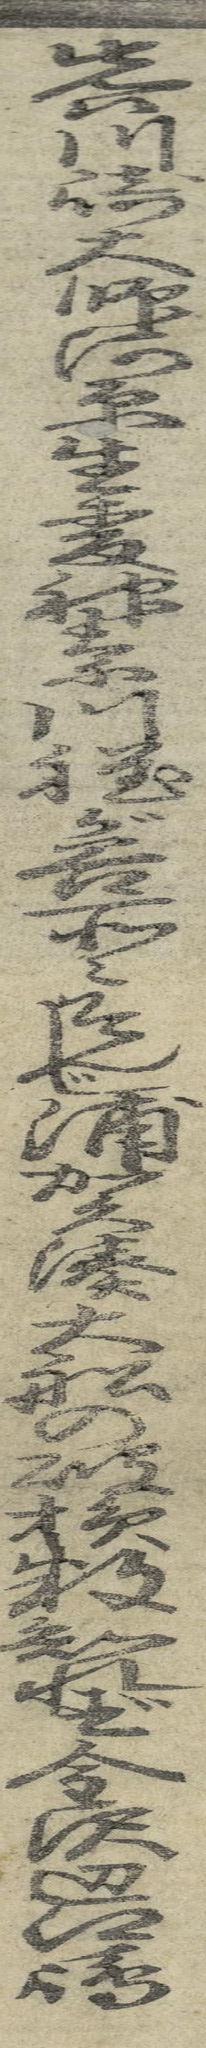先ハ川崎大師河原生麦神奈川程ヶ谷所々そんじ浦賀湊大船の破損数しれず金沢辺江嶋
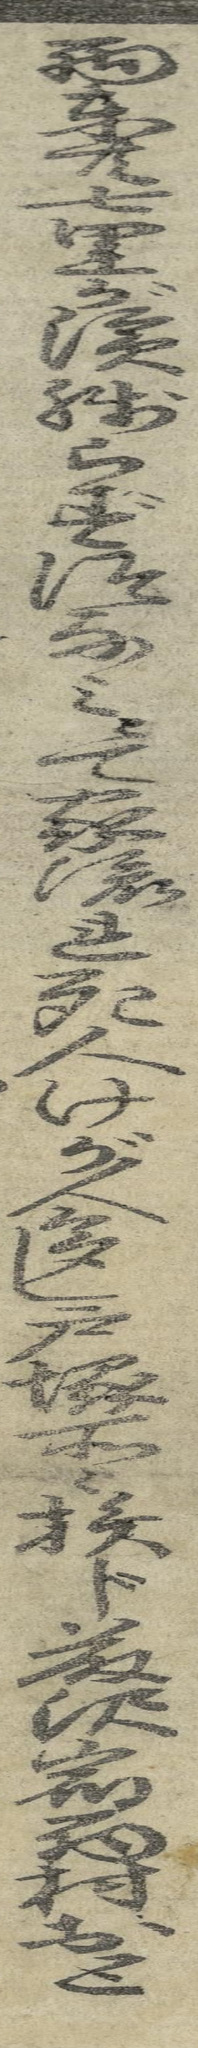西東共七里ヶ濱残らずつなミ二て家流れ死人けが人多し戸塚所々損じ藤沢宿西村おと
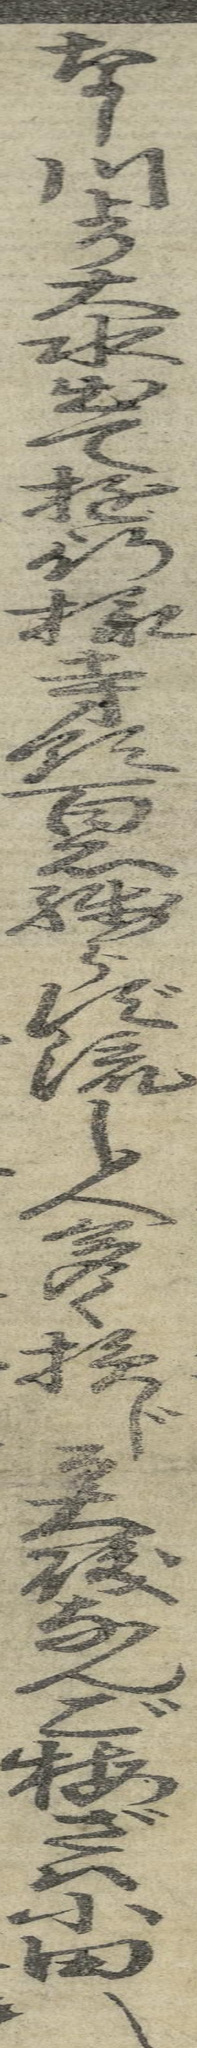なし川より大水出て遊行様寺領百石残らず流し人多く損じる大磯なんご梅ざハ小田
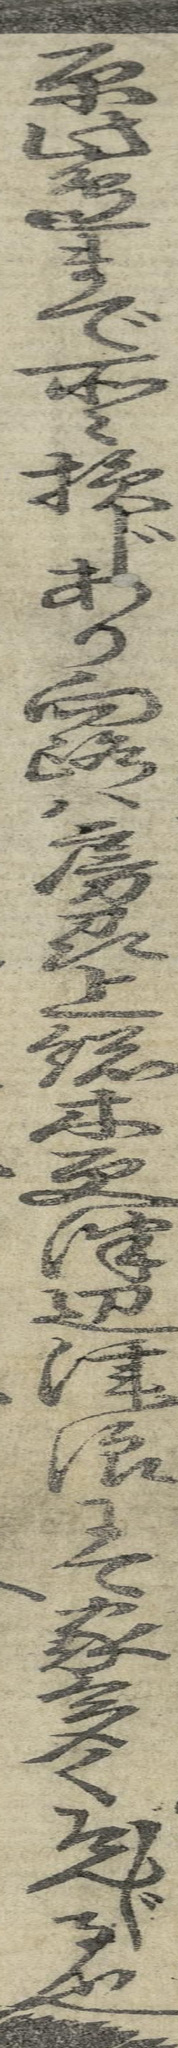原此辺まで所々損じあり向路は房州上総木更津辺津浪にて家多くそんじる也
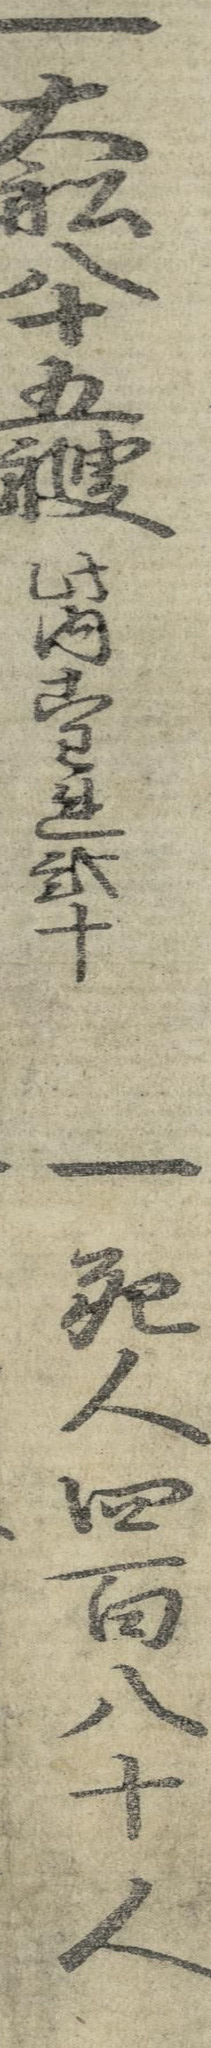一大船八十五艘此内こわれ弐十一死人四百八十人
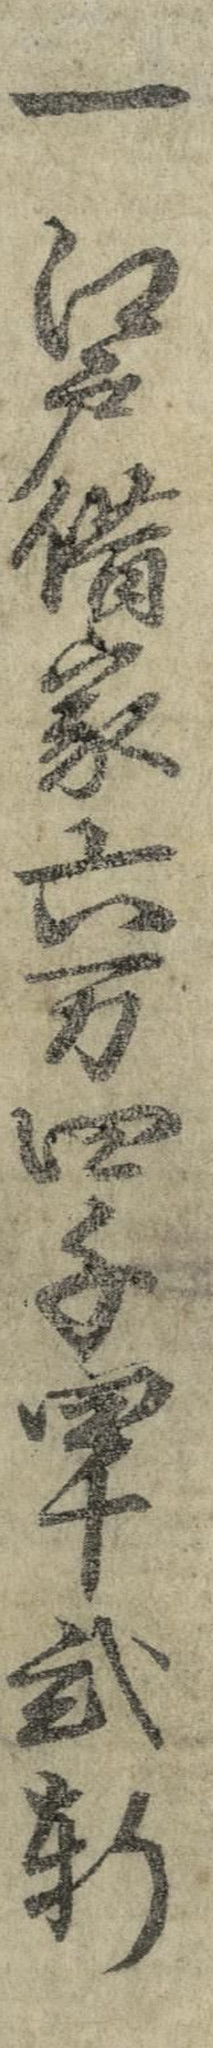一江戸借家六万四千四十弐軒
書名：安政三辰八月廿五日　大風雨出水損場所之圖
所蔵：東京大学地震研究所図書室 Earthquake Research Institute Library, The University of Tokyo, JAPAN
